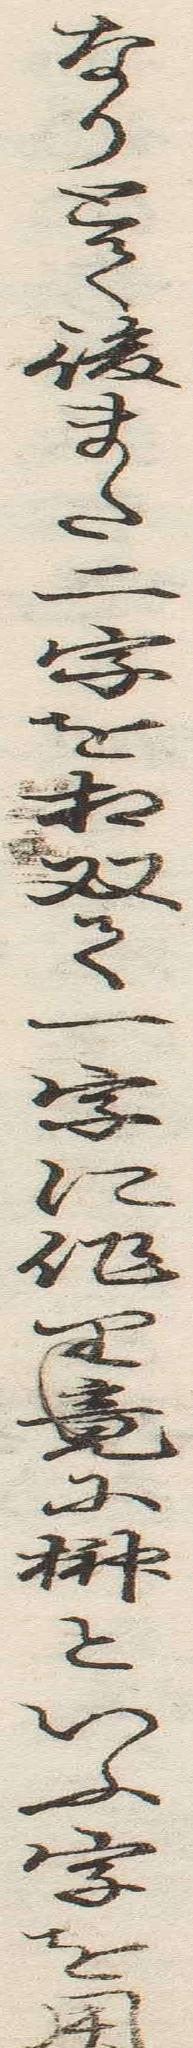なりとて後また二字を相双て一字に作り竟に榊といふ字を用
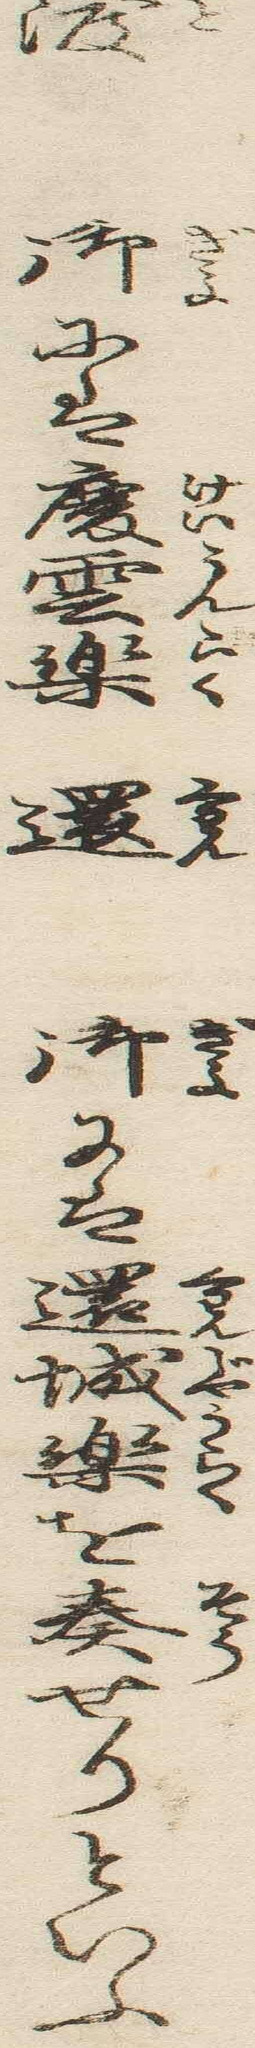渡御には慶雲樂還御には還城樂を奏せりといふ

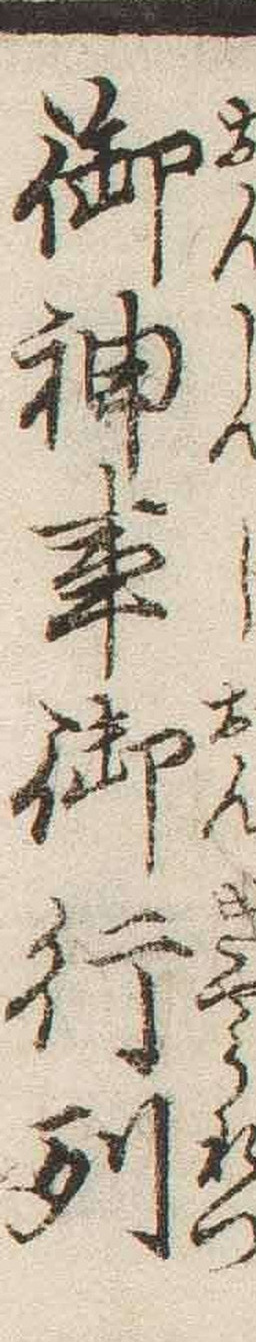御神事御行列
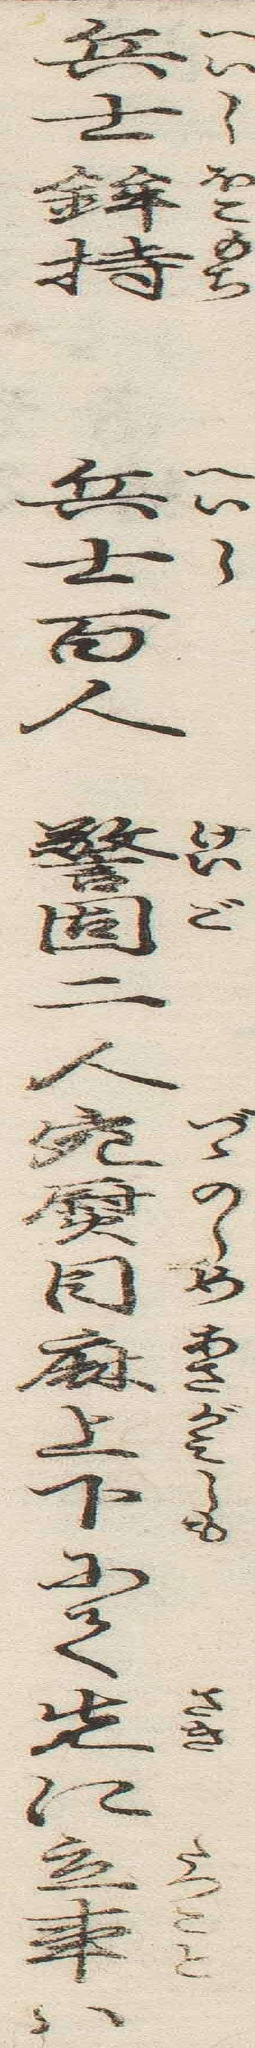兵士鉾持兵士百人警固二人宛熨目麻上下にて先に立事は
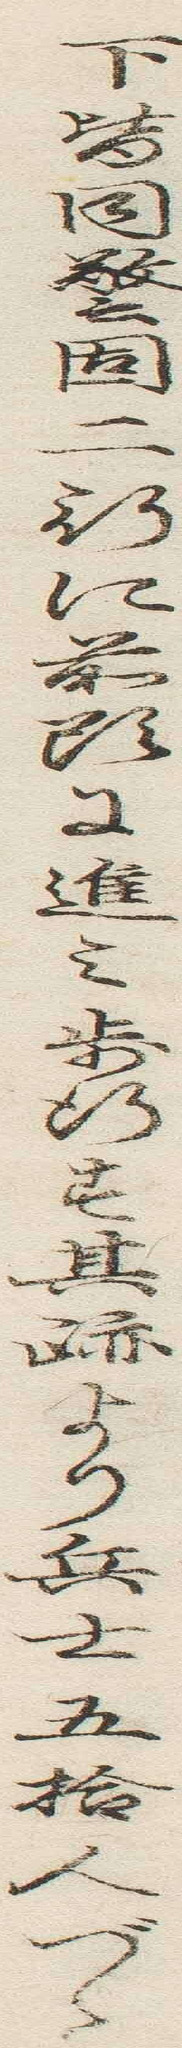下皆同警固二行に前頭に進み歩行す其跡より兵士五拾人づゝ
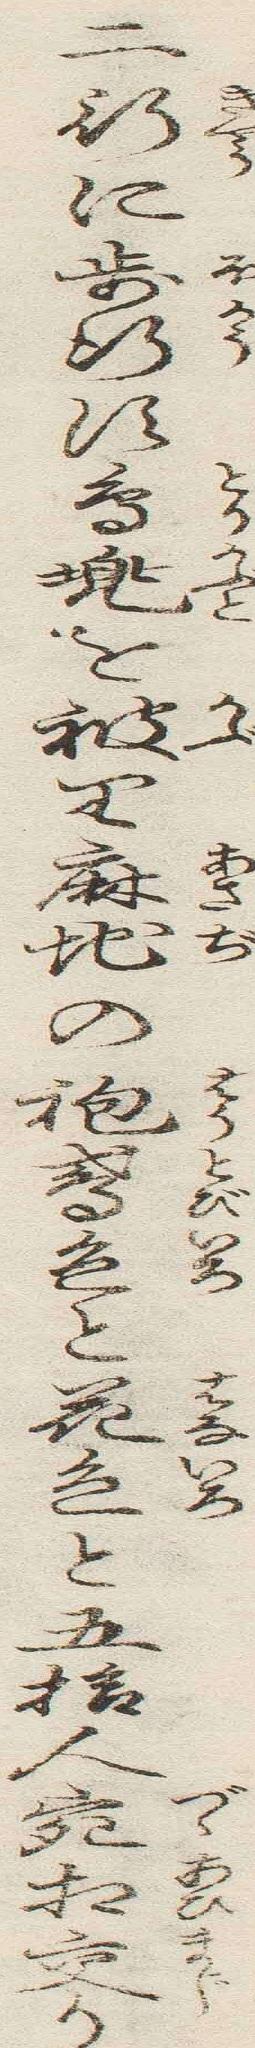二行に歩行す鳥兠を被り麻地の袍鳶色と花色と五拾人宛相交り
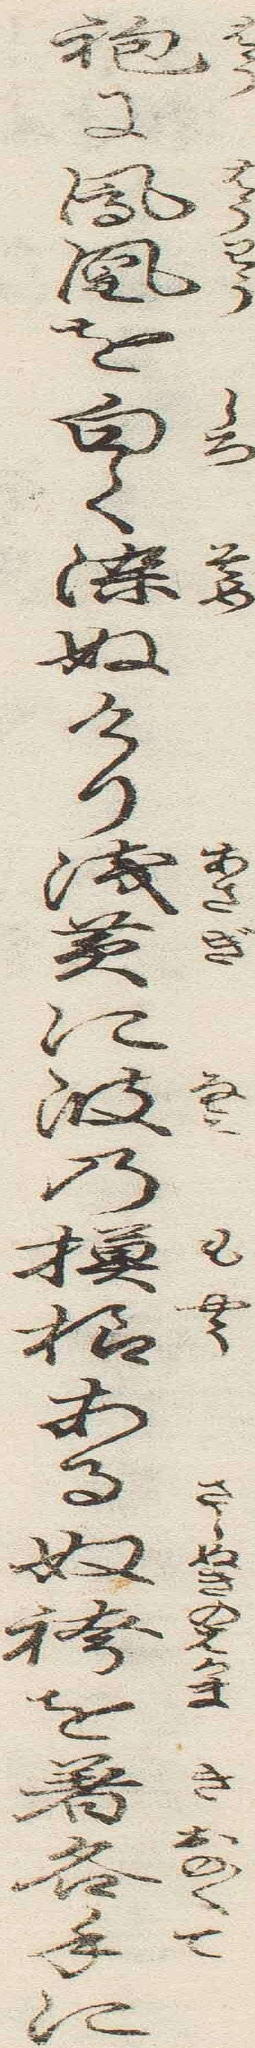袍に鳳凰を白く染ぬけり淺黄に波の摸様ある奴袴を着各手に
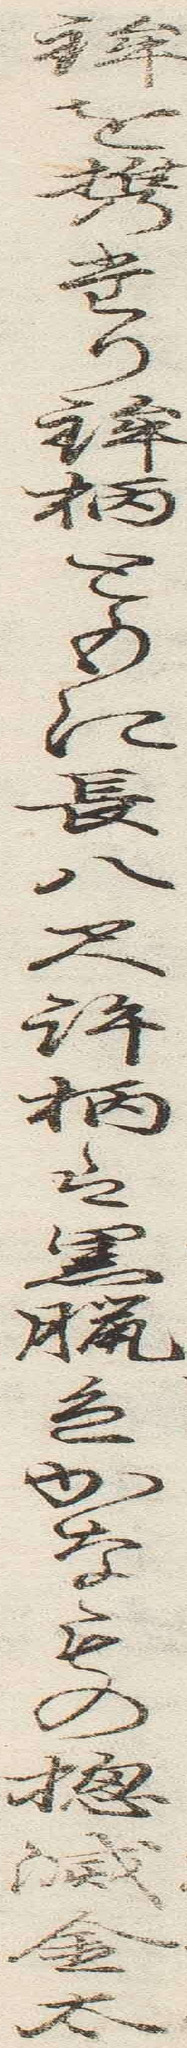鉾を携たり鉾柄ともに長八尺許柄は黒臘色かなもの揔滅金太
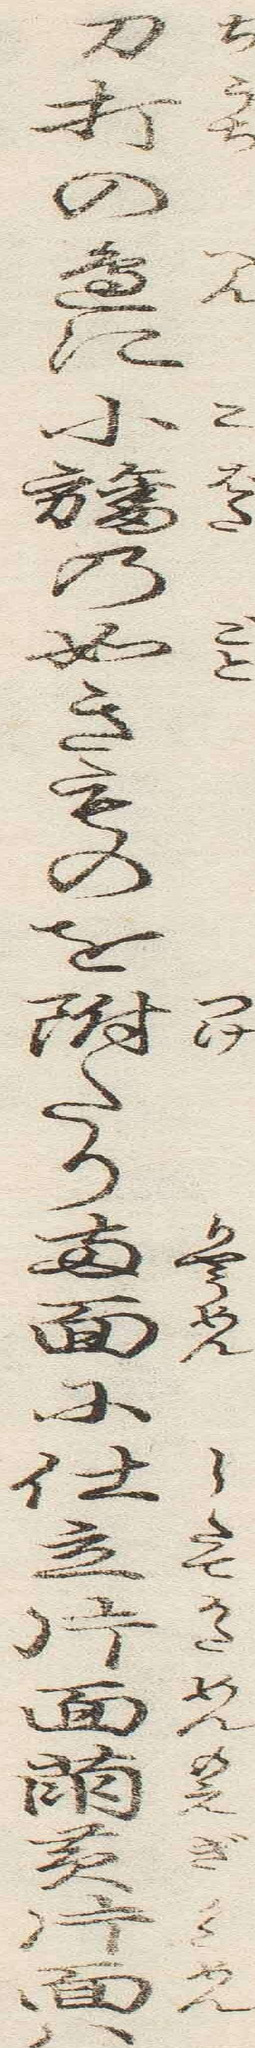刀打の邊に小旛の如きものを附たり両面に仕立片面萠黃片面は
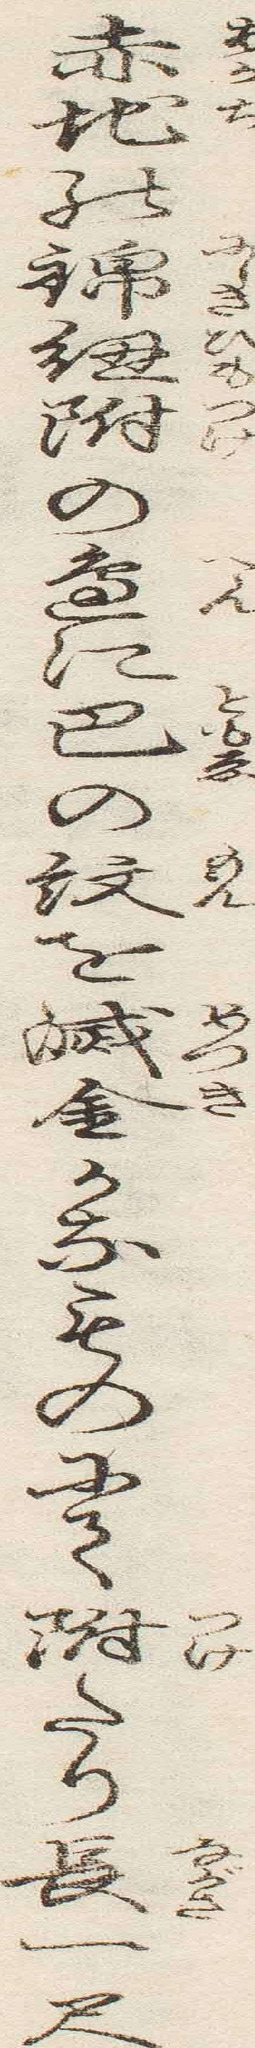赤地の錦紐附の邊に巴の紋を滅金かなものにて附たり長一尺
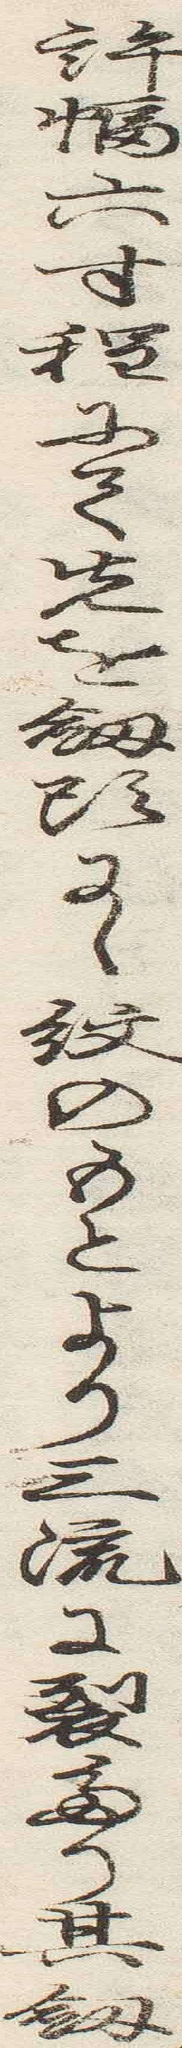許幅六寸程にて先を剱頭にし紋のもとより三流に裂たり其剱
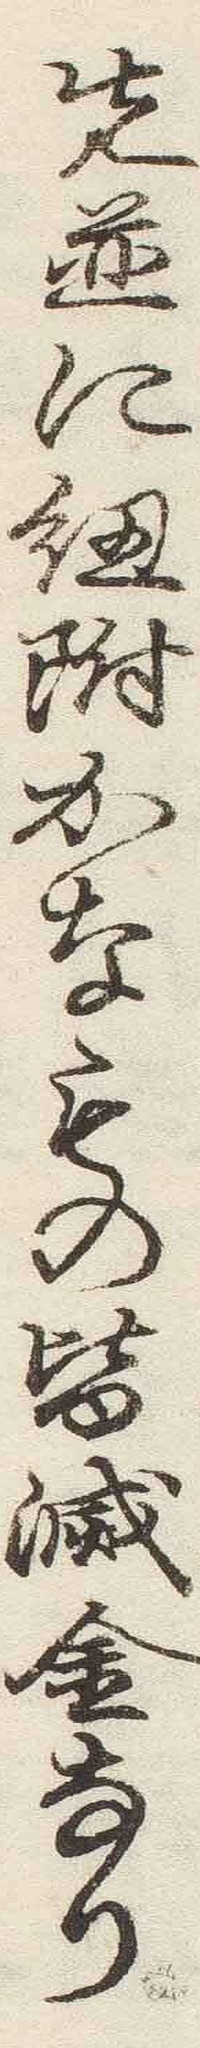先並に紐附かなもの皆滅金なり
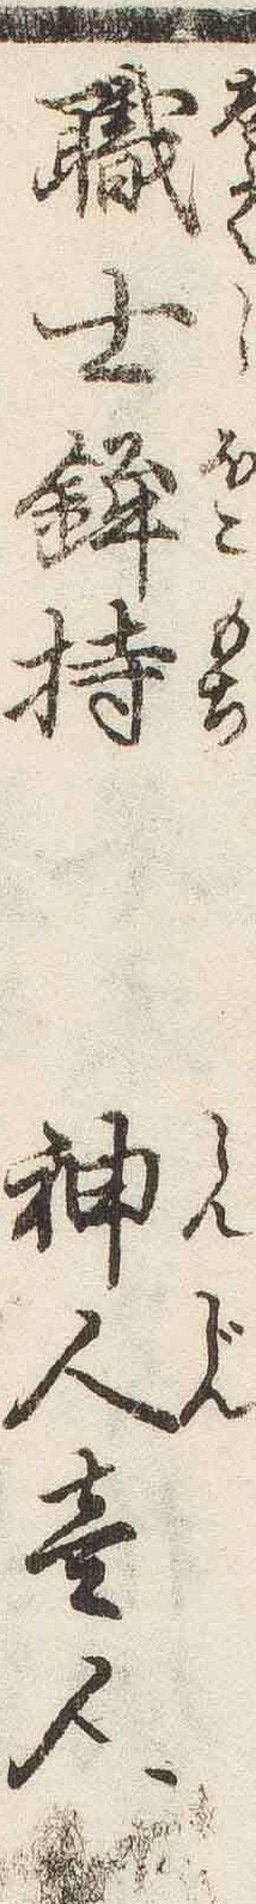職士鉾持神人壹人
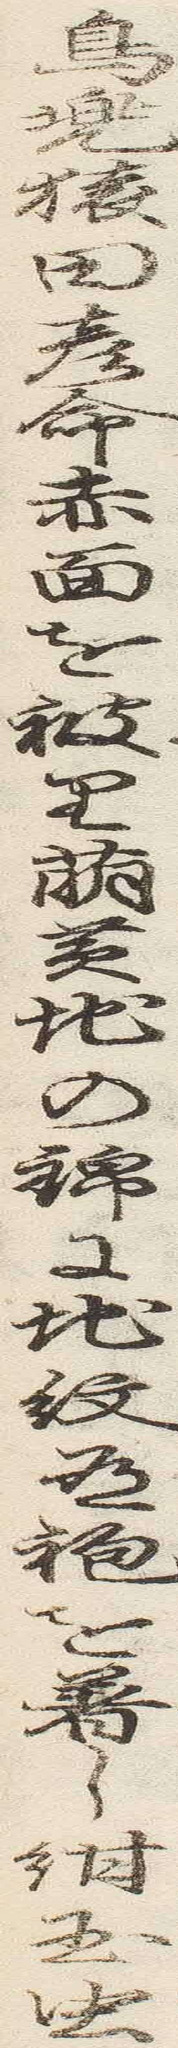鳥兠猿田彦命赤面を被り萠黃地の錦に地紋有袍を着し紺玉虫
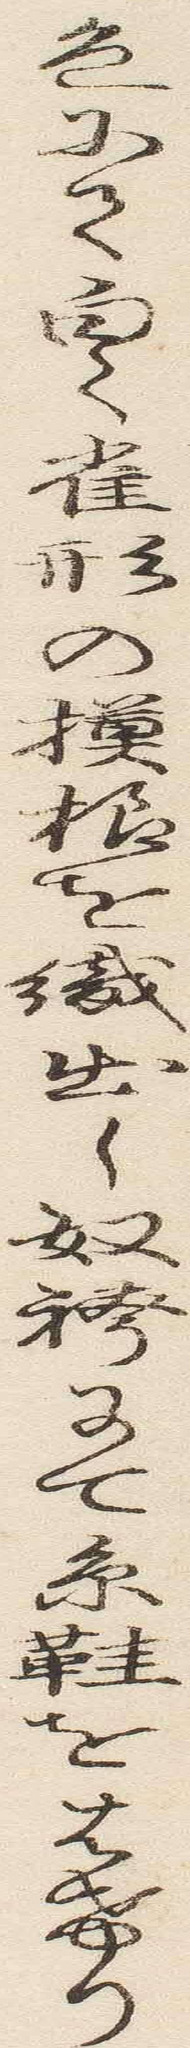色にて白く雀形の摸様を織出し奴袴にて糸鞋をはけり
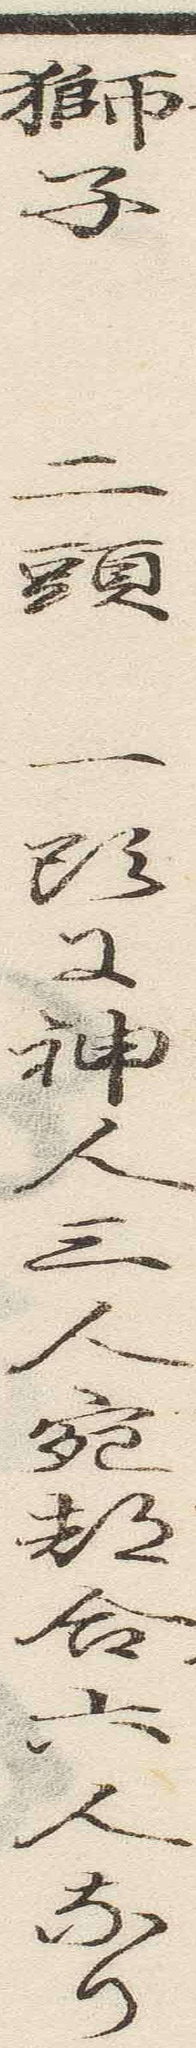獅子二頭一頭は神人三人宛都合六人なり
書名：日光山志
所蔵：東京学芸大学附属図書館 国文学研究資料館
